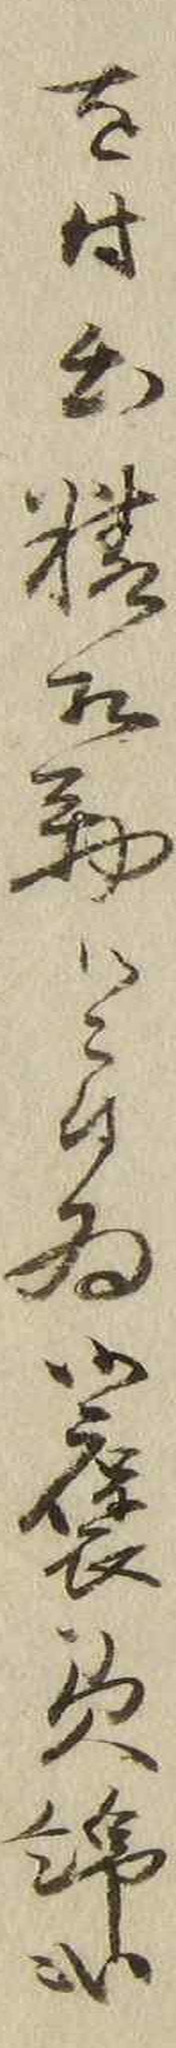を付出精相勤候ニ付為御褒美綿弐
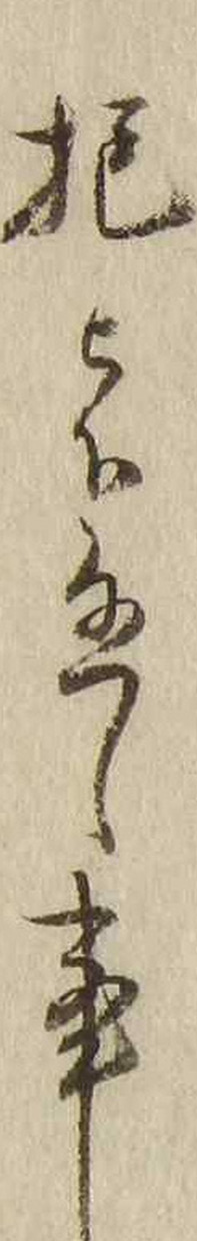把被下置候事

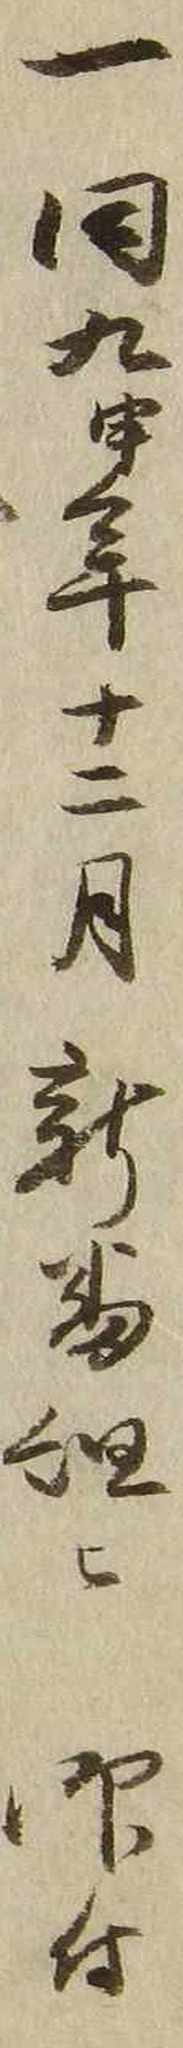一同九申年十二月新番組被仰付
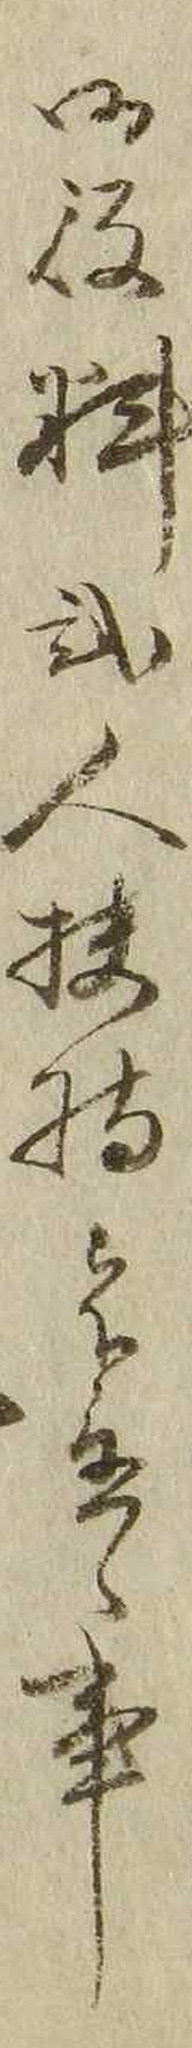御役料弐人扶持被下置候事
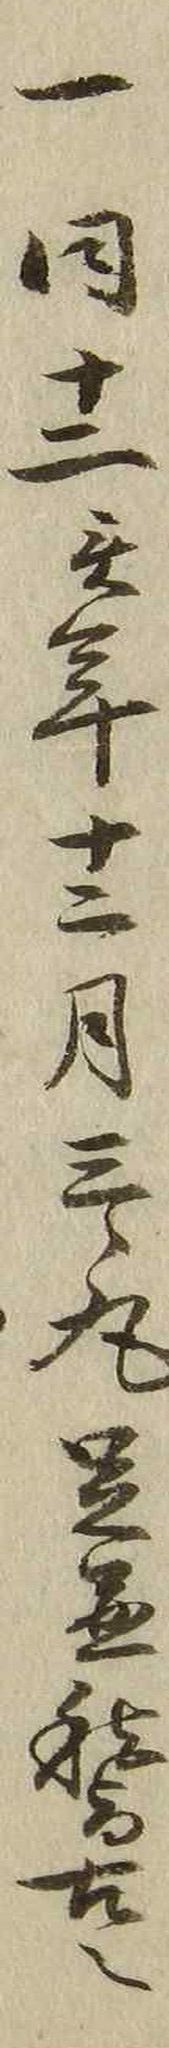一同十二亥年十二月三ノ丸足並稽古之
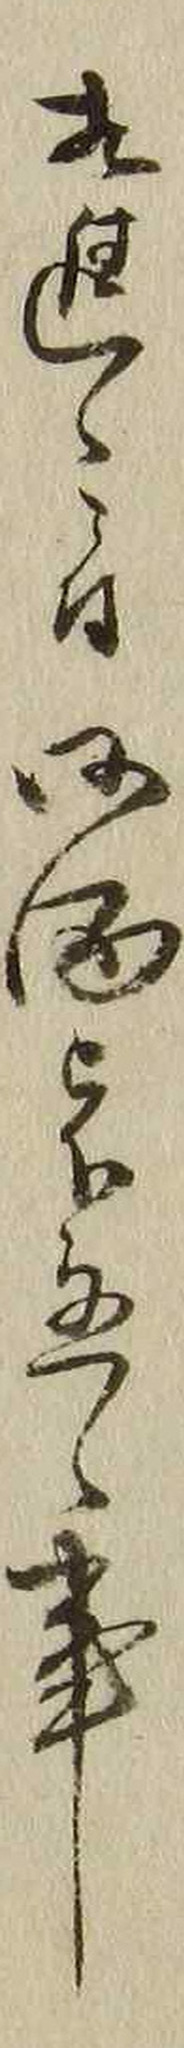相進候ニ付御酒被下置候事
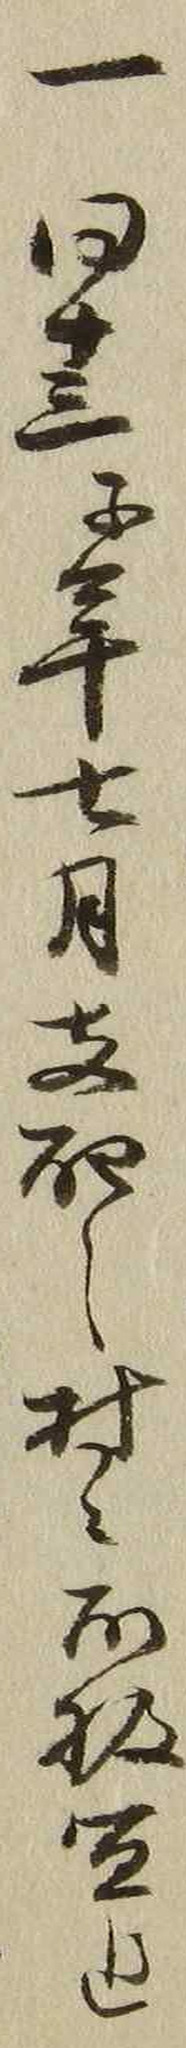一同十三子年七月支配之村々取扱宜追
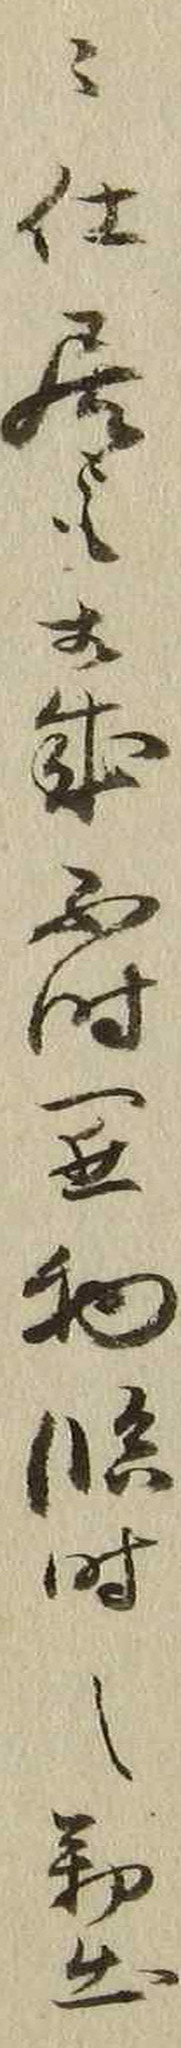々仕居も相成不時囲物臨時之勤出
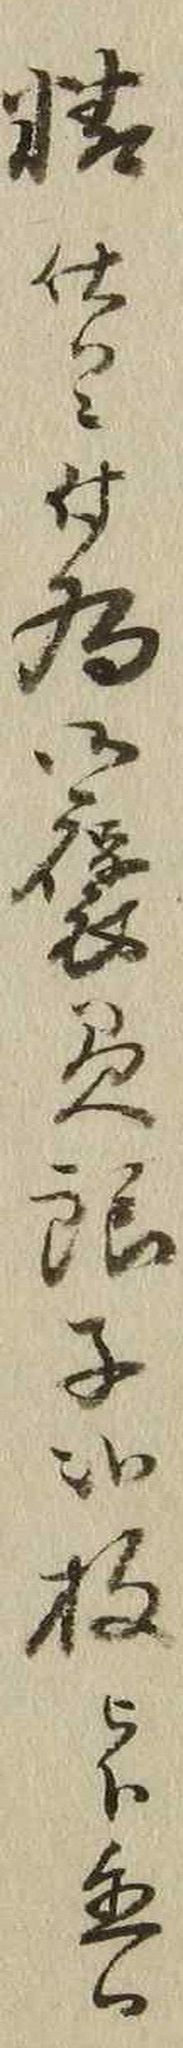精仕候ニ付為御褒美銀子弐枚被下置候
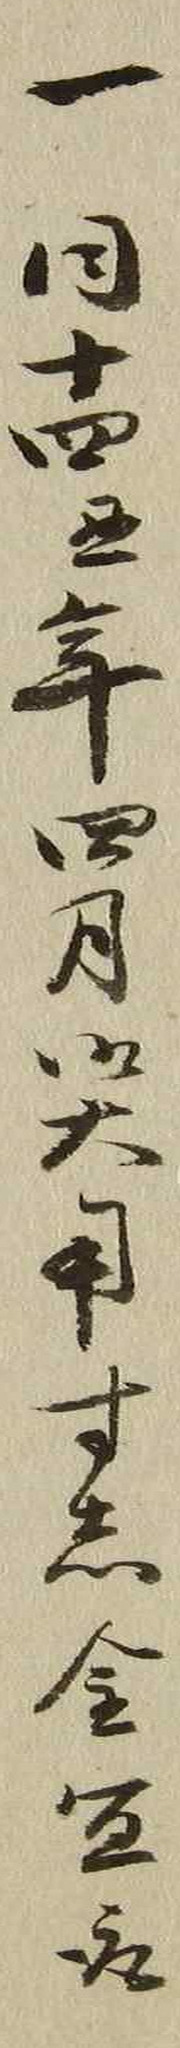一同十四丑年四月御大用寸志金宜取
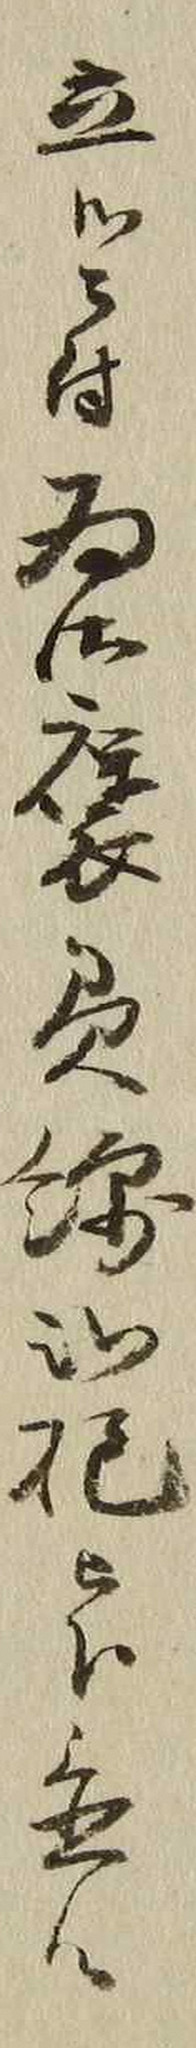立候ニ付為御褒美綿弐把被下置候
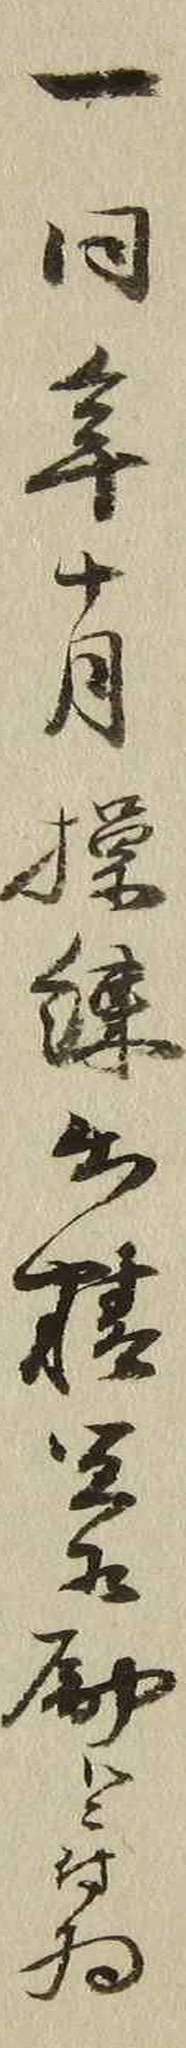一同年十月操錬出精宜相励候ニ付為
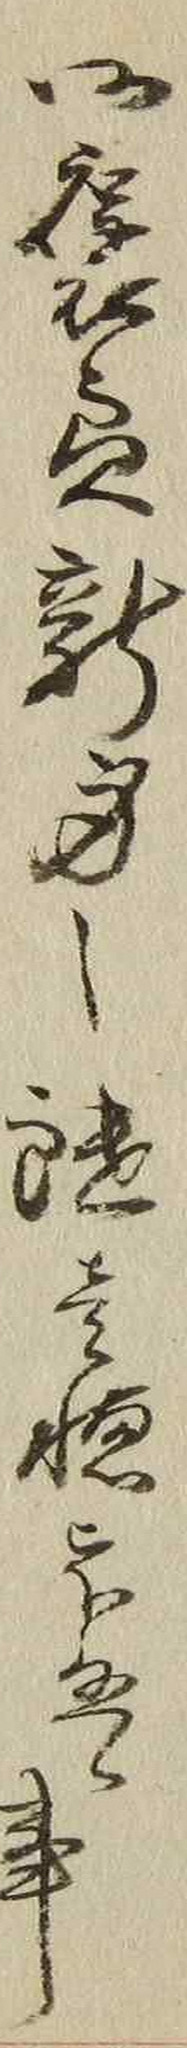御褒美新身之鑓壱穂被下置候事
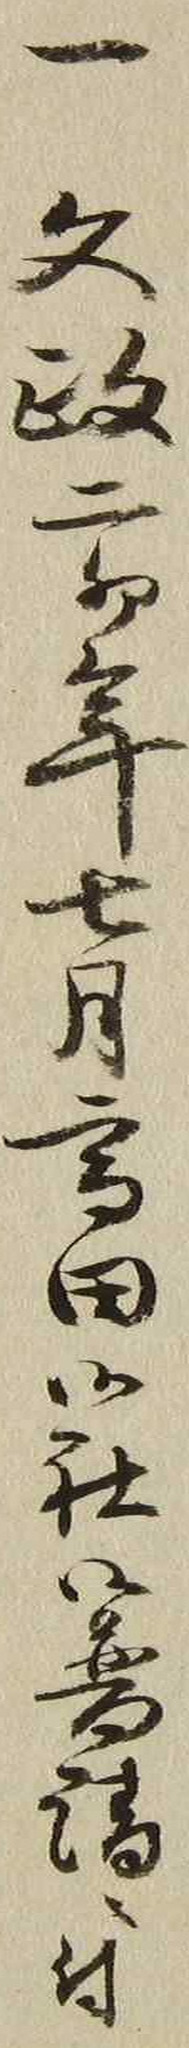一文政二卯年七月高田御社普請ニ付
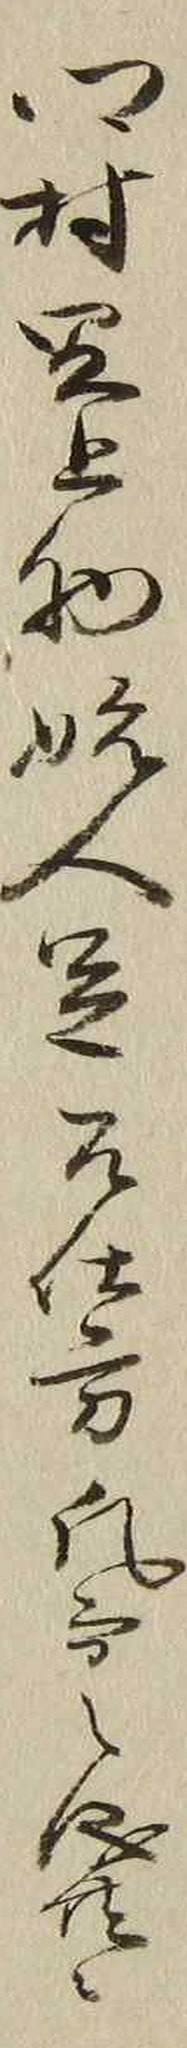郷村買上物始人足召仕方凡而之儀共々
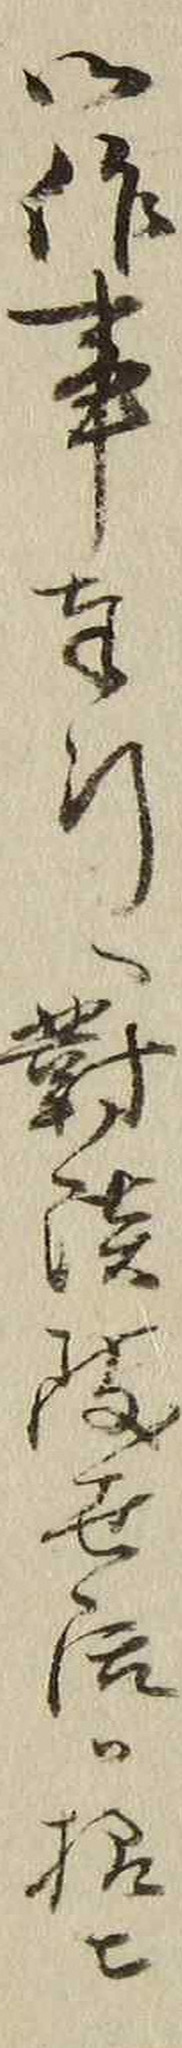御作事奉行へ対談致世話候様被
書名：諸士系譜　巻之236　ふ之部4
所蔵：会津若松市立会津図書館
